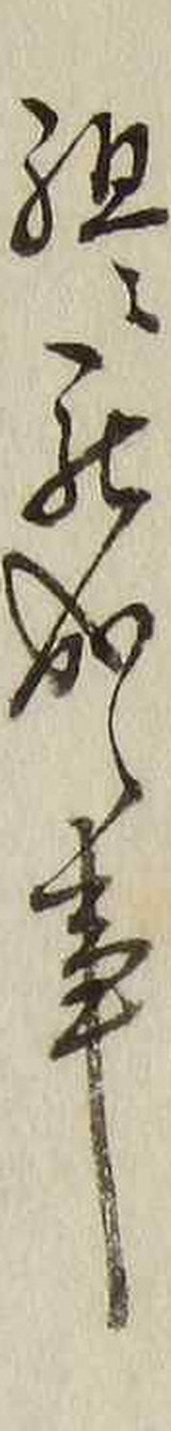組ニ罷成候事
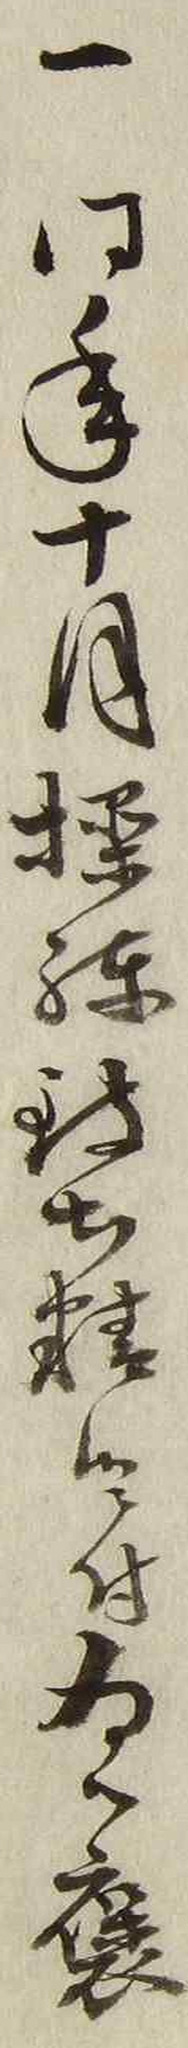一同年十月操練致出精候ニ付為御褒
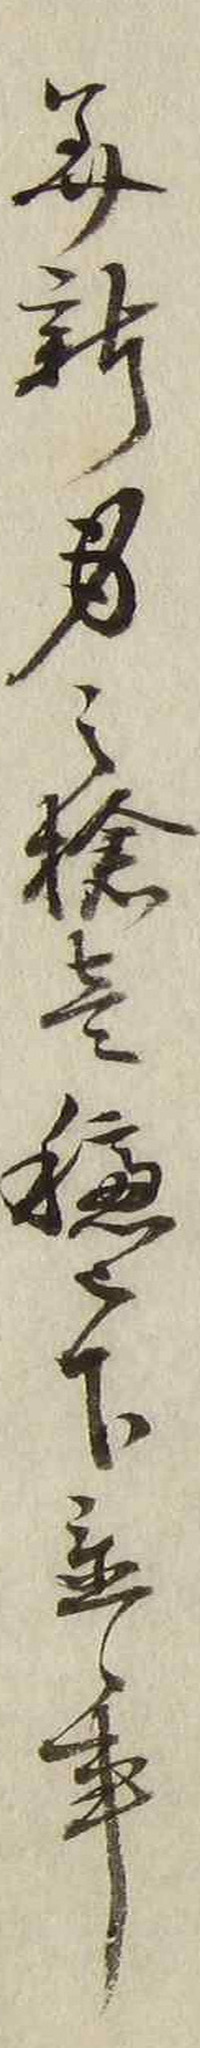美新身之槍壱穂被下置候事
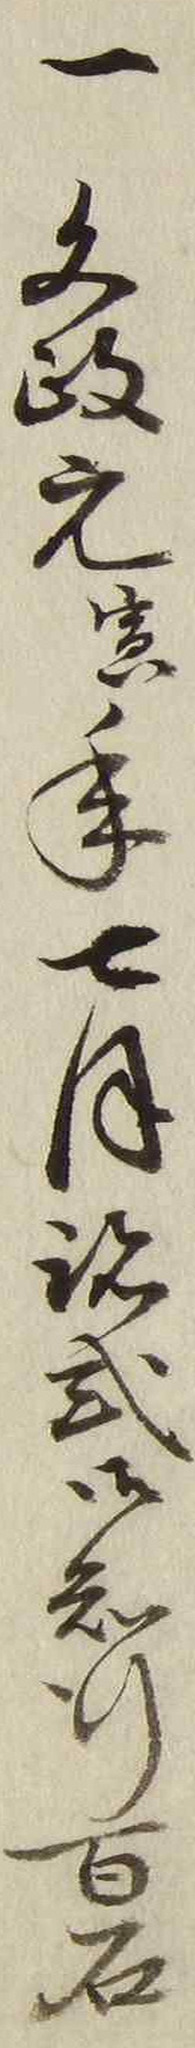一文政元寅年七月跡式御知行百石

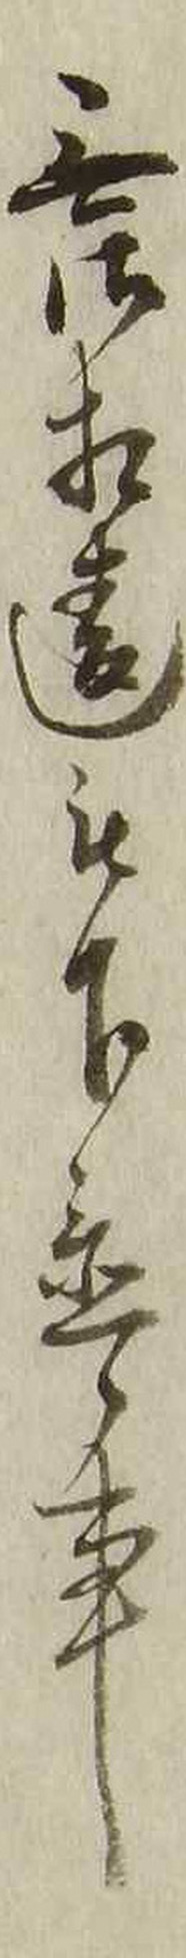無御相違被下置候事
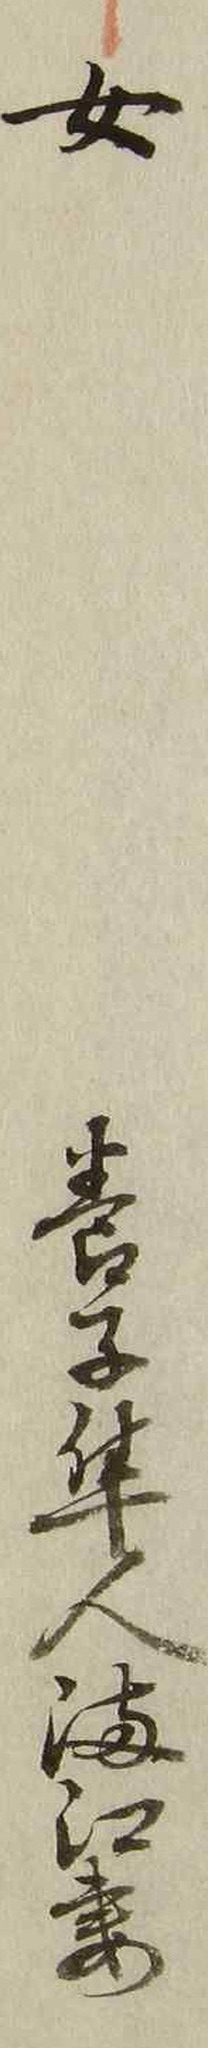女養子隼人満江妻
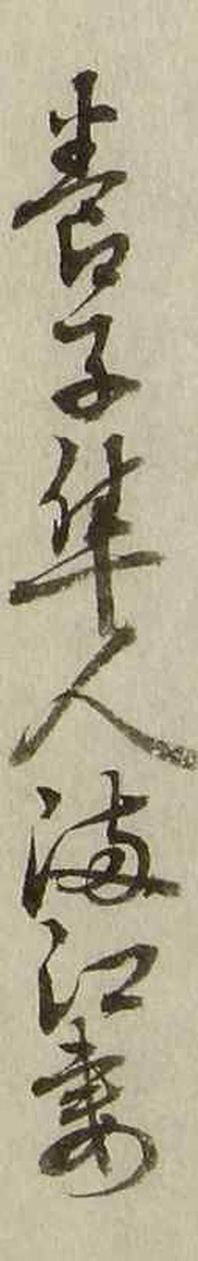女養子隼人満江妻
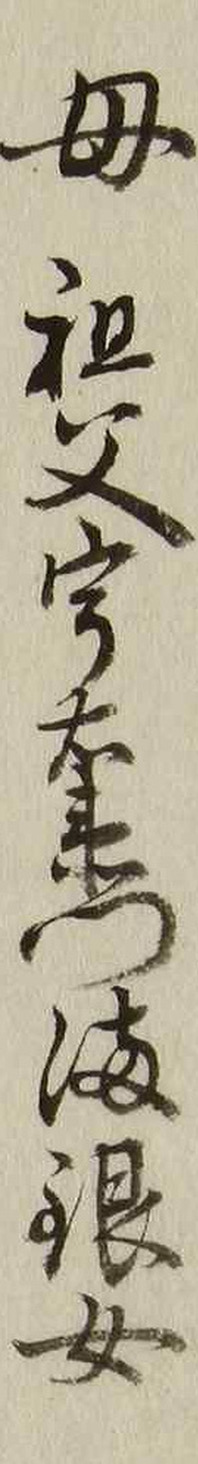母祖父宇右衛門満銀女
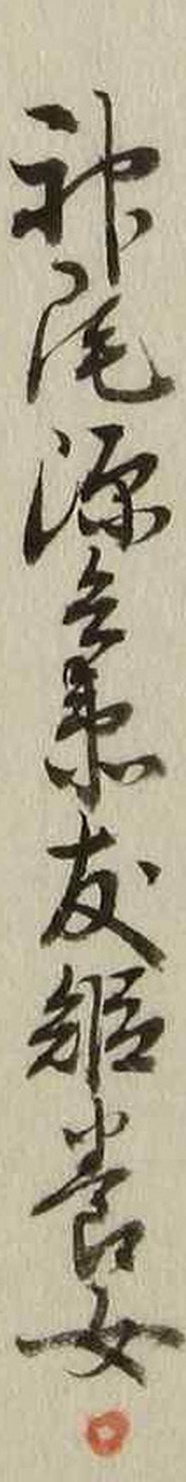神尾源兵衛友矩養女◦
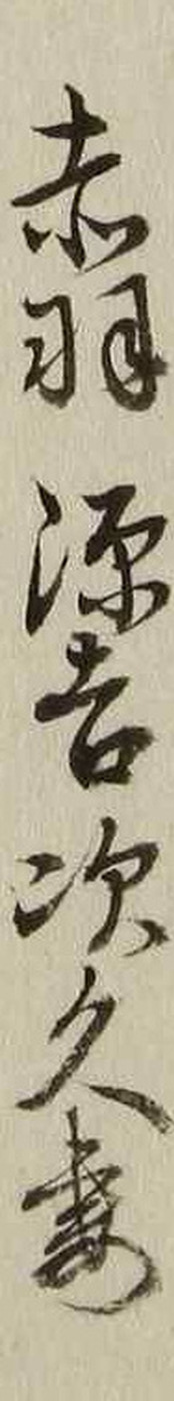赤羽源吉次久妻
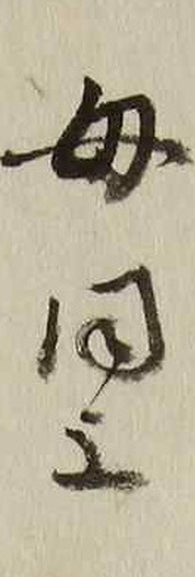母同上
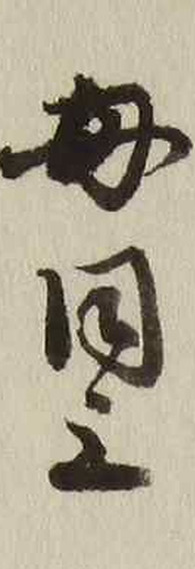母同上
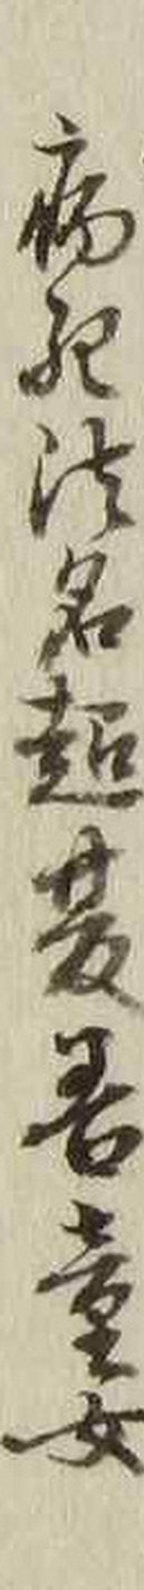病死法名超夏善童女
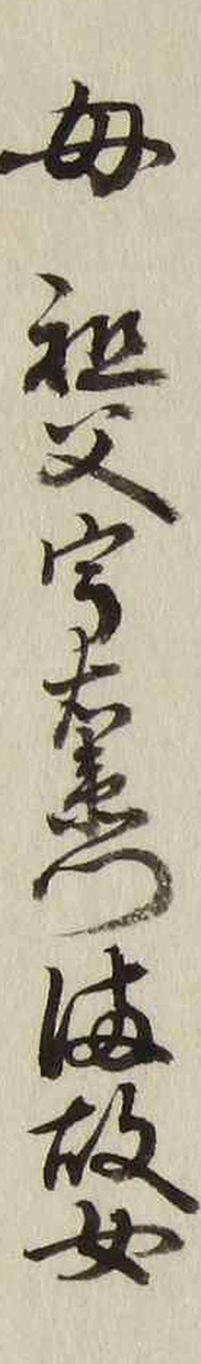母祖父宇右衛門満故女
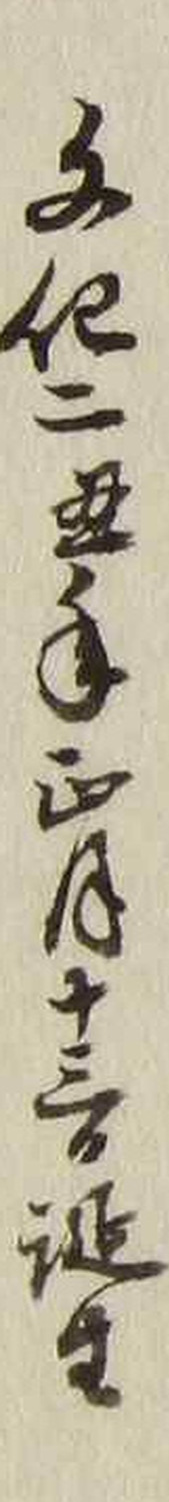文化二丑年正月十三日誕生
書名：諸士系譜　巻之27　い之部27
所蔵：会津若松市立会津図書館
